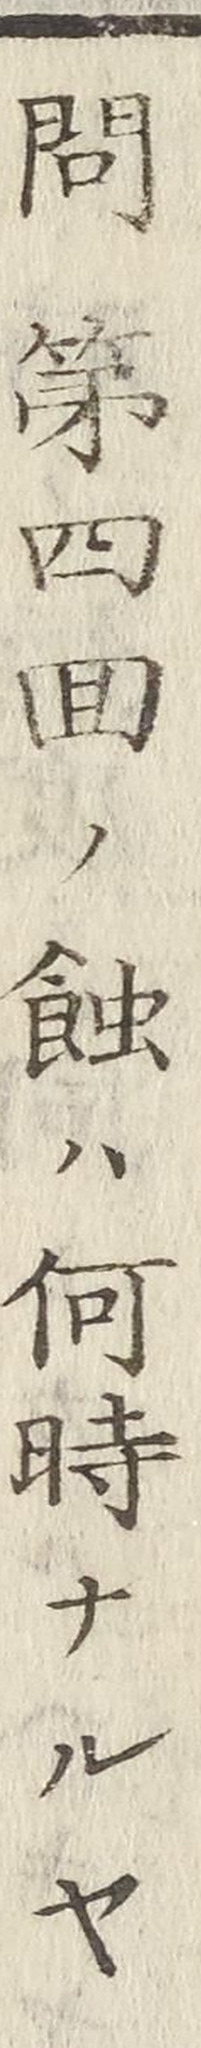問第四回ノ蝕ハ何時ナルヤ
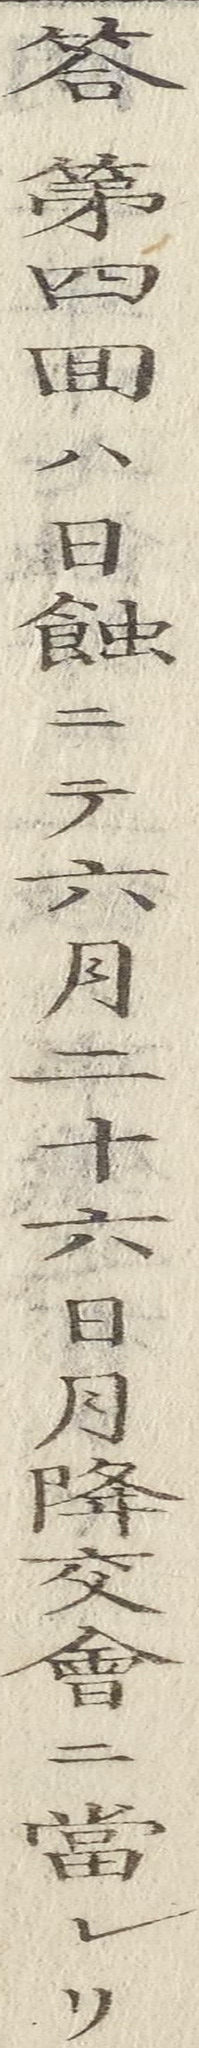答第四回ハ日蝕ニテ六月二十六日月降交会ニ当レリ
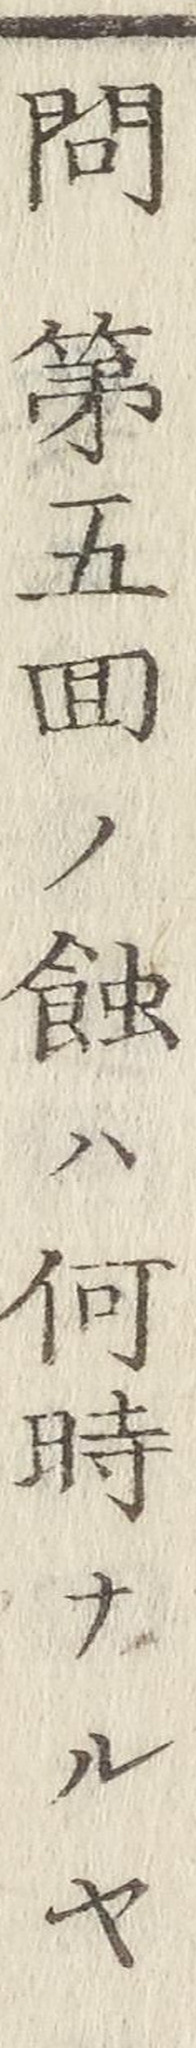問第五回ノ蝕ハ何時ナルヤ
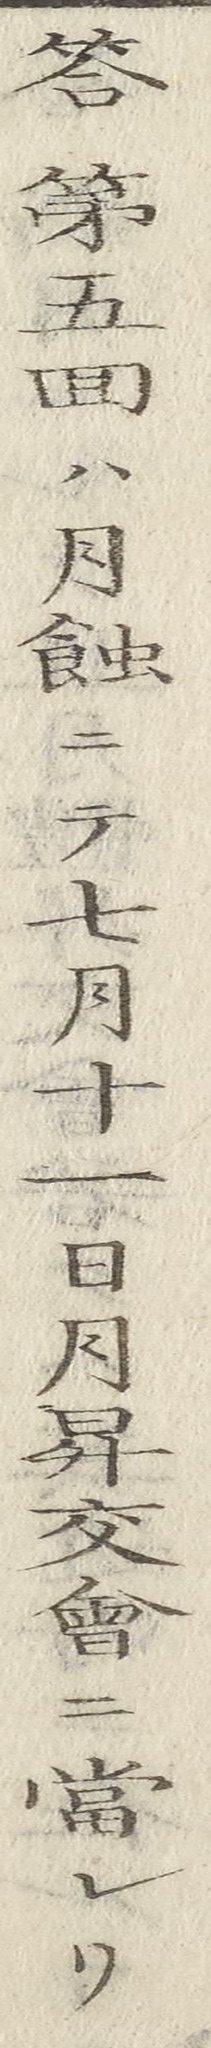答第五回ハ月蝕ニテ七月十一日月昇交会ニ当レリ
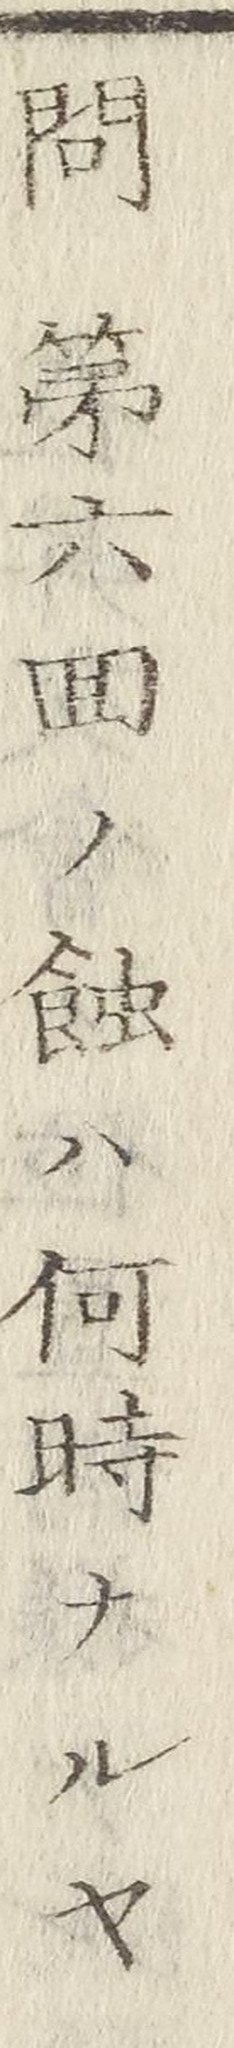問第六回ノ蝕ハ何時ナルヤ
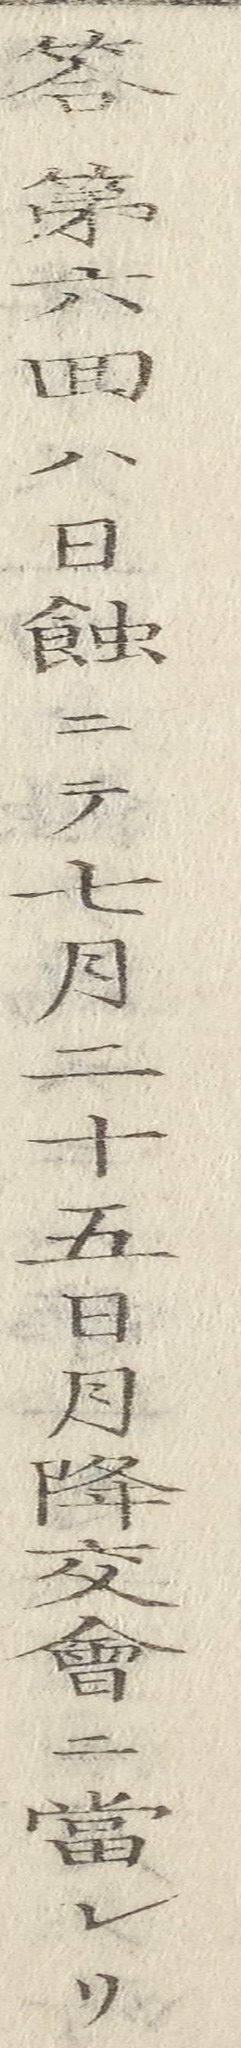答第六回ハ日蝕ニテ七月二十五日月降交会ニ当レリ
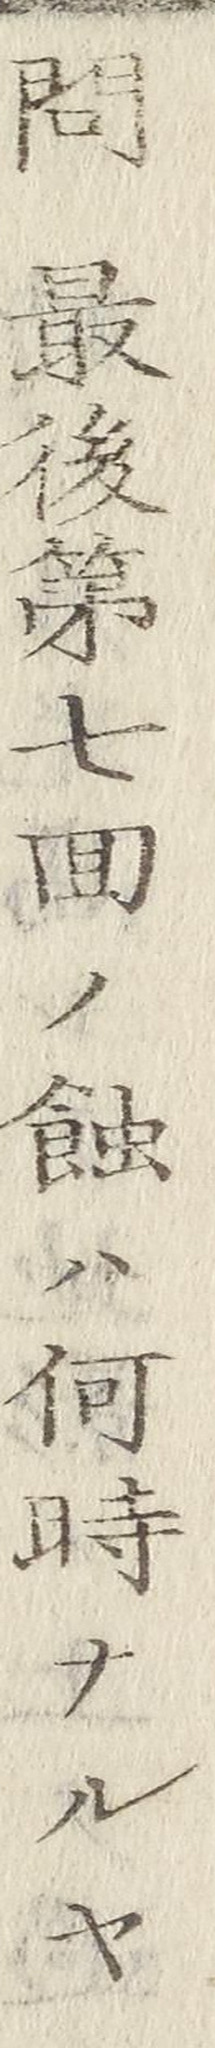問最後第七回ノ蝕ハ何時ナルヤ
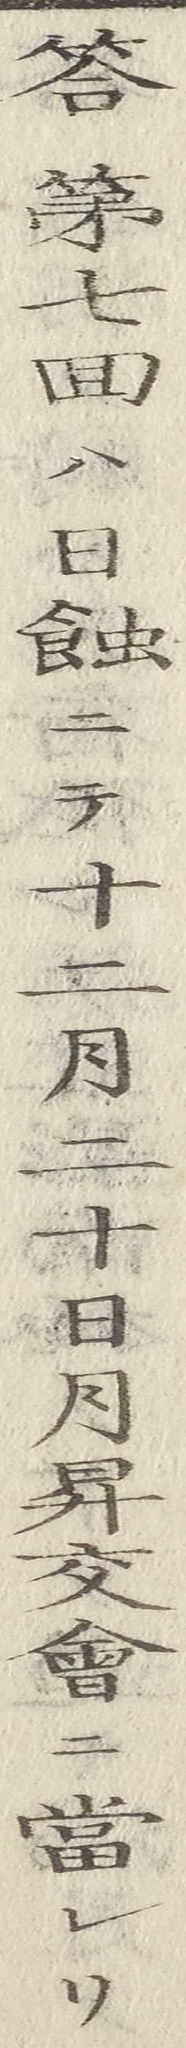答第七回ハ日蝕ニテ十二月二十日月昇交会ニ当レリ
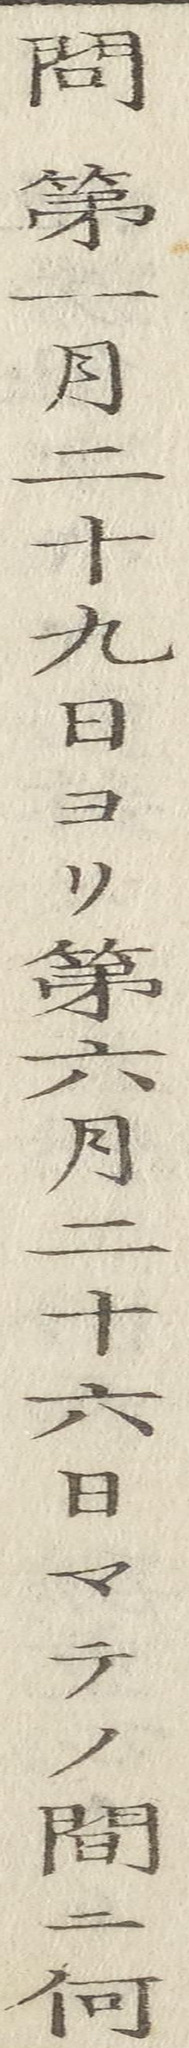問第一月二十九日ヨリ第六月二十六日マテノ間ニ何
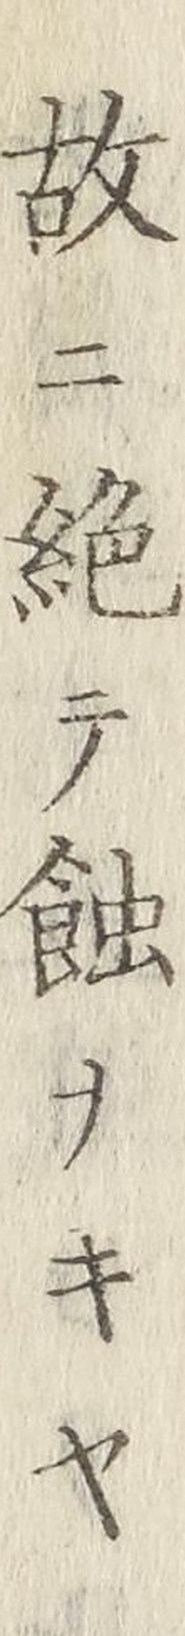故ニ絶テ蝕ナキヤ
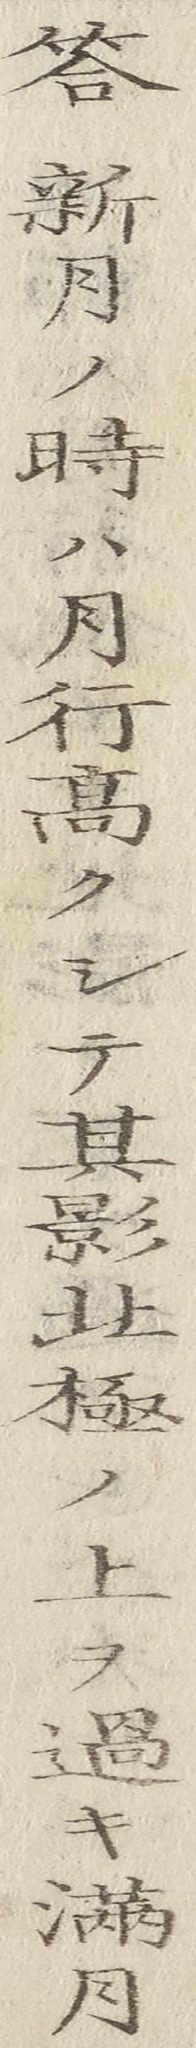答新月ノ時ハ月行高クシテ其影北極ノ上ヲ過キ満月

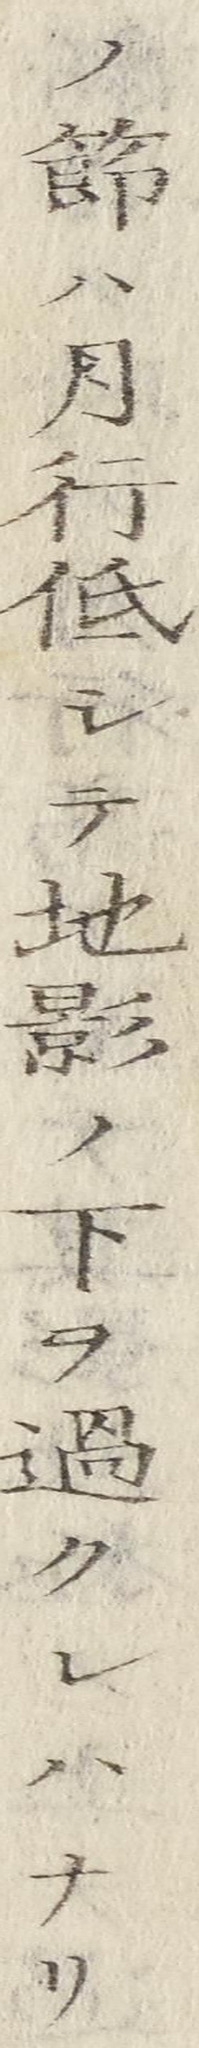ノ節ハ月行低シテ地影ノ下ヲ過クレハナリ
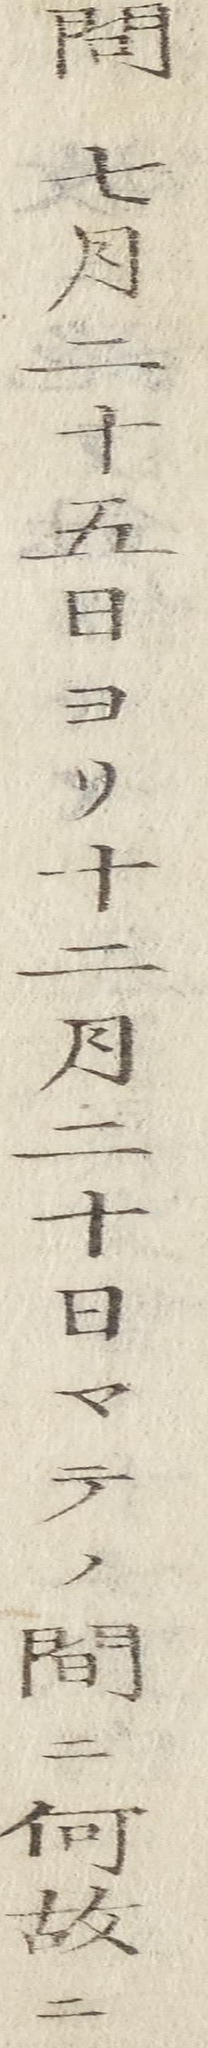問七月二十五日ヨリ十二月二十日マテノ間ニ何故ニ
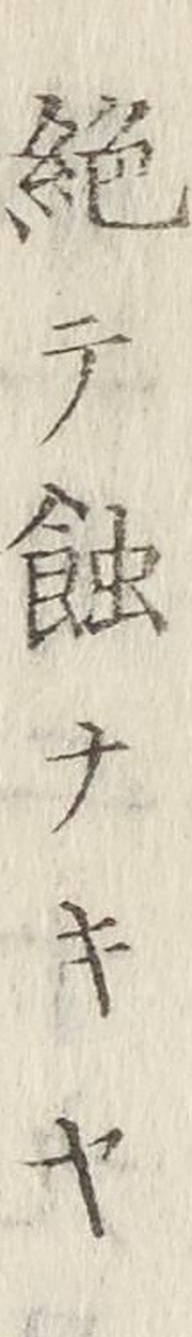絶テ蝕ナキヤ
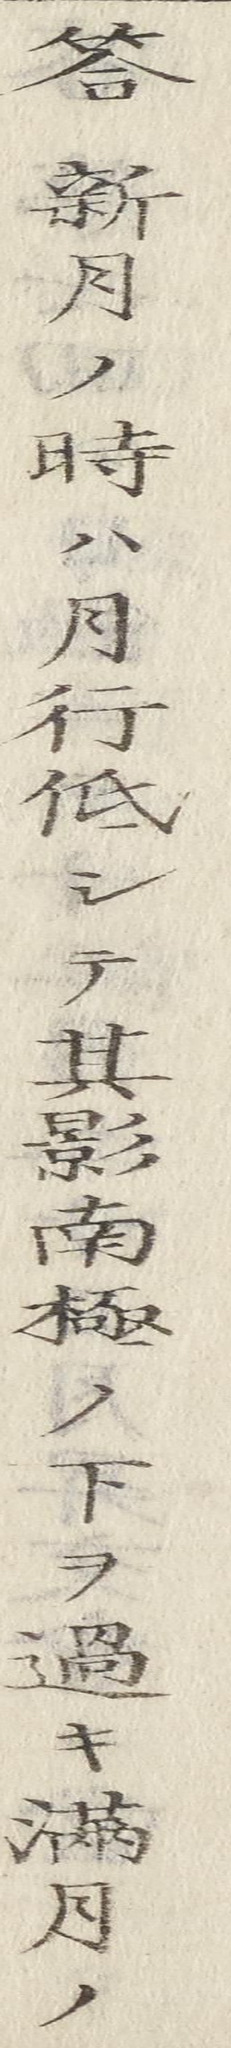答新月ノ時ハ月行低シテ其影南極ノ下ヲ過キ満月ノ
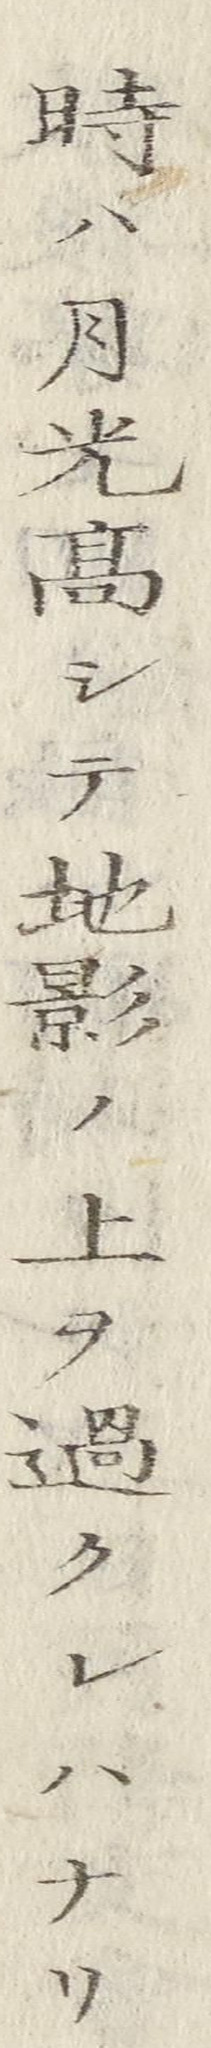時ハ月光高シテ地影ノ上ヲ過クレハナリ
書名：星学圖説　下
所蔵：東京大学地震研究所図書室 Earthquake Research Institute Library, The University of Tokyo, JAPAN
